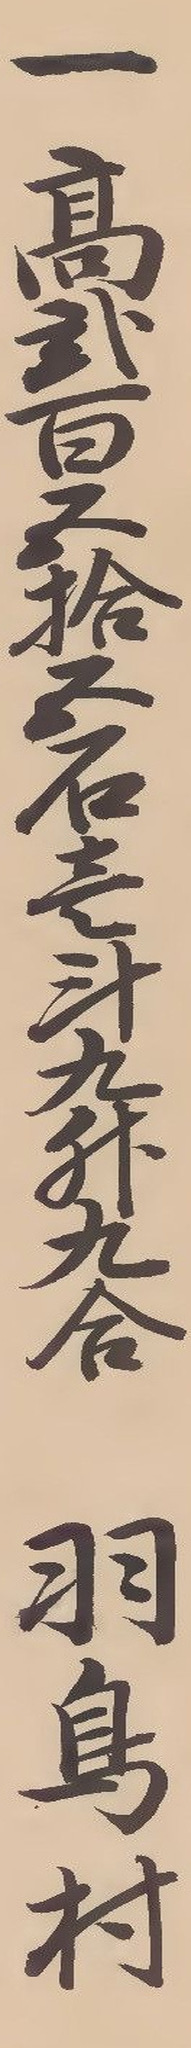一高弐百五拾五石壱斗九升九合羽鳥村
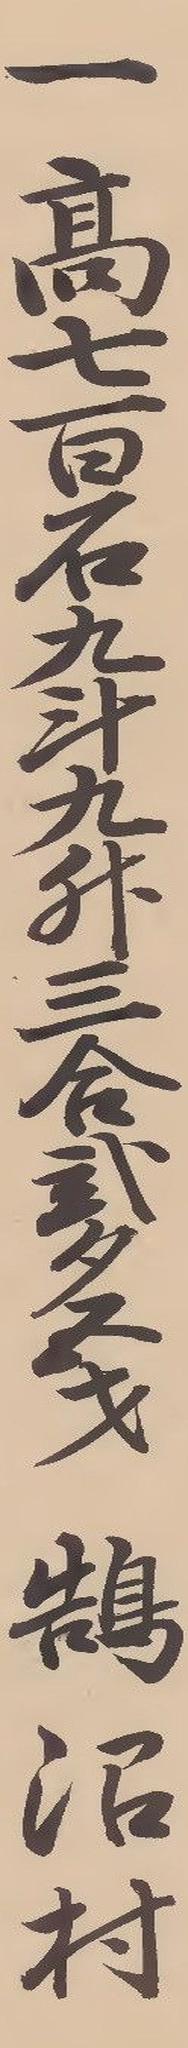一高七百石九斗九升三合弐勺五才鵠沼村
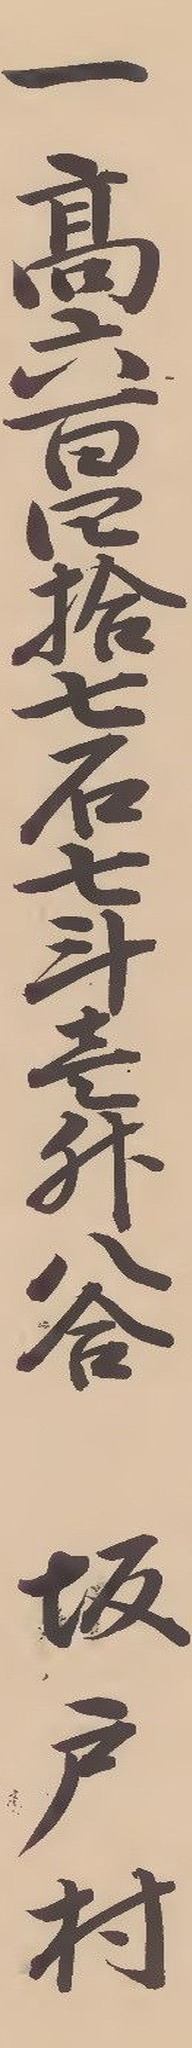一高六百四拾七石七斗壱升八合坂戸村
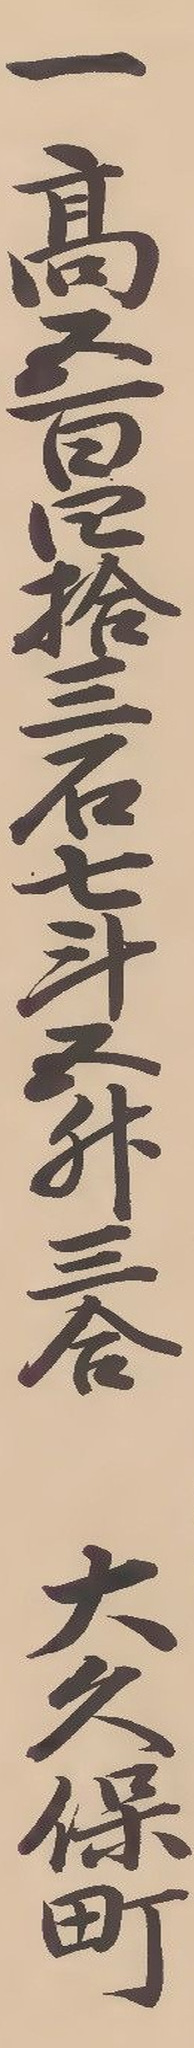一高五百四拾三石七斗五升三合大久保町
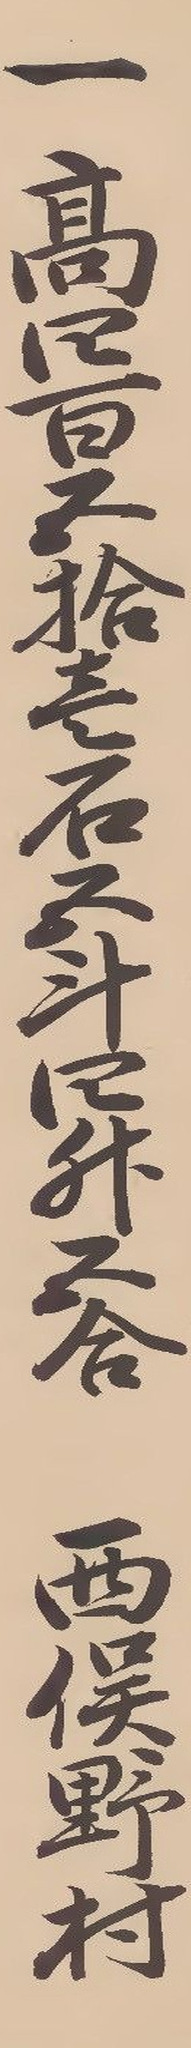一高四百五拾壱石五斗四升五合西俣野村
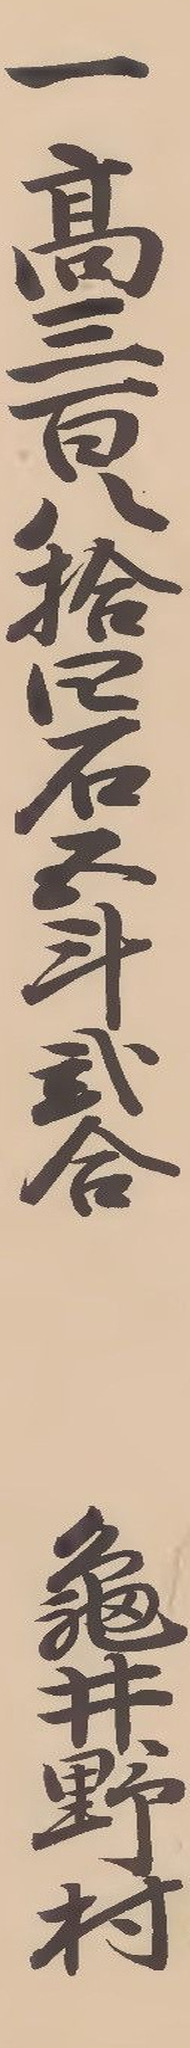一高三百八拾四石五斗弐合亀井野村
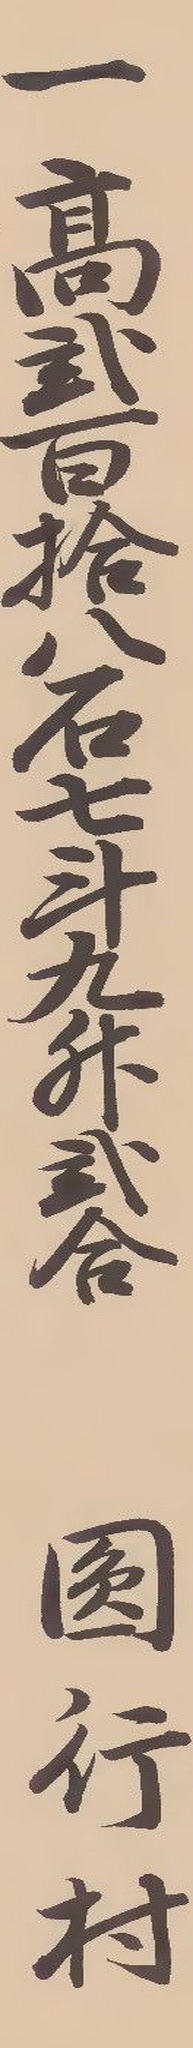一高弐百拾八石七斗九升弐合円行村

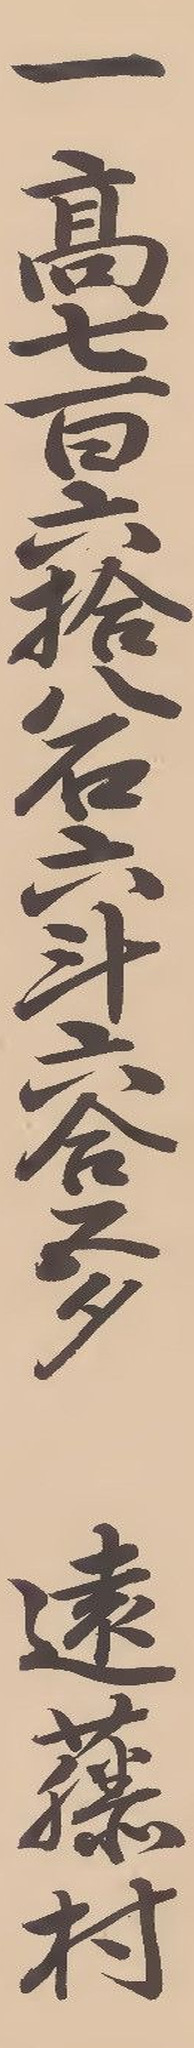一高七百六拾八石六斗六合五勺遠藤村
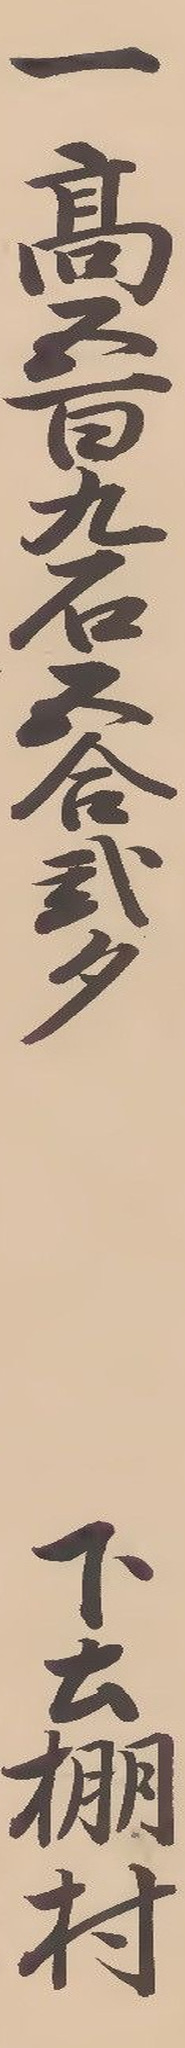一高五百九石五合弐勺下土棚村
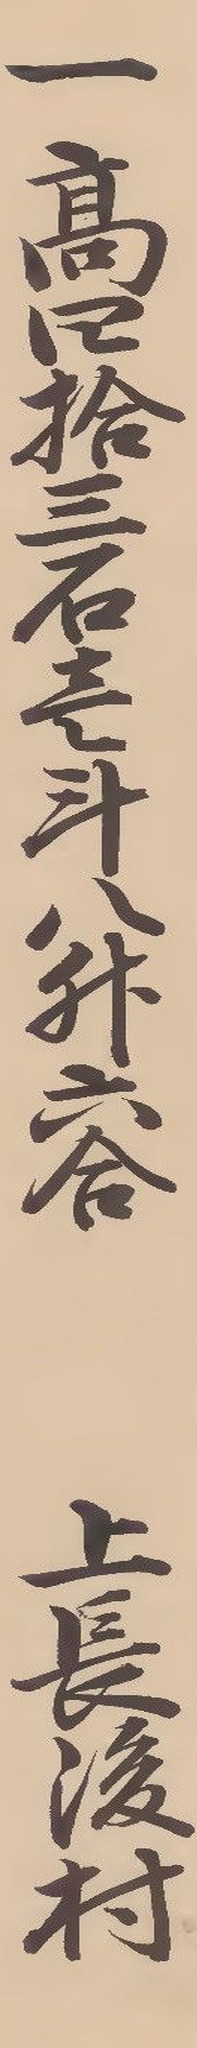一高四拾三石壱斗八升六合上長後村

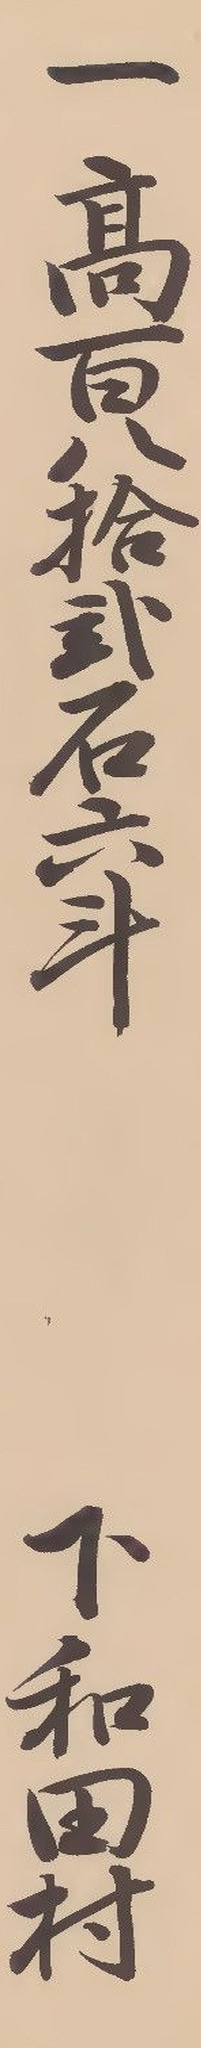一高百八拾弐石六斗下和田村
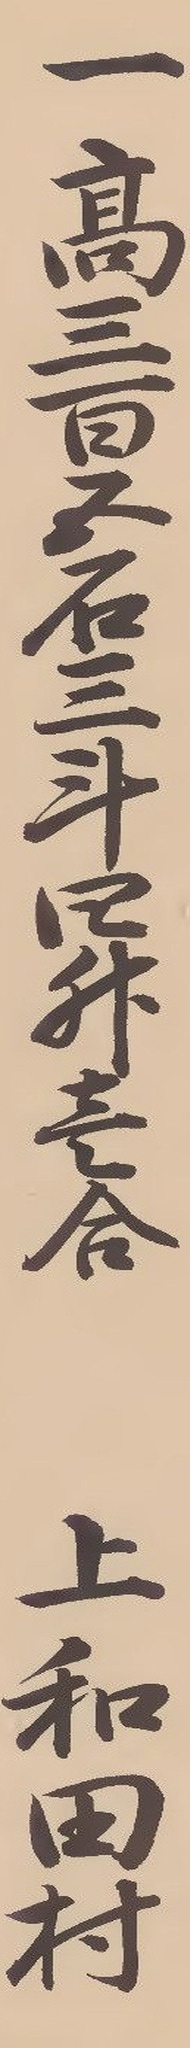一高三百五石三斗四升壱合上和田村
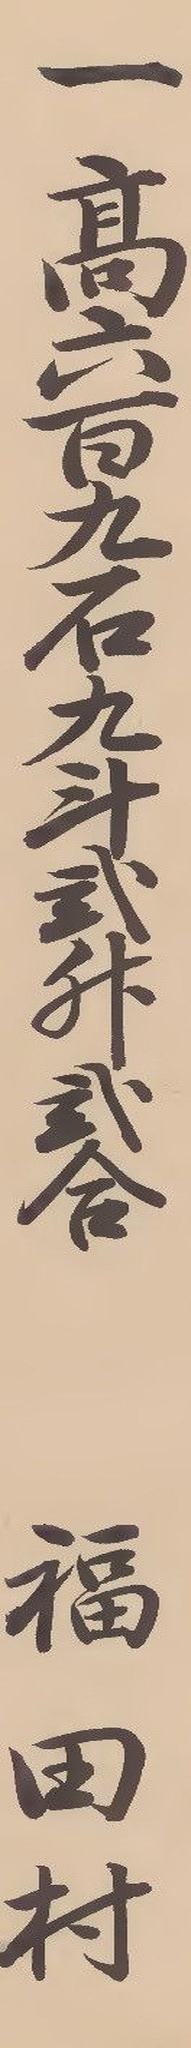一高六百九石九斗弐升弐合福田村
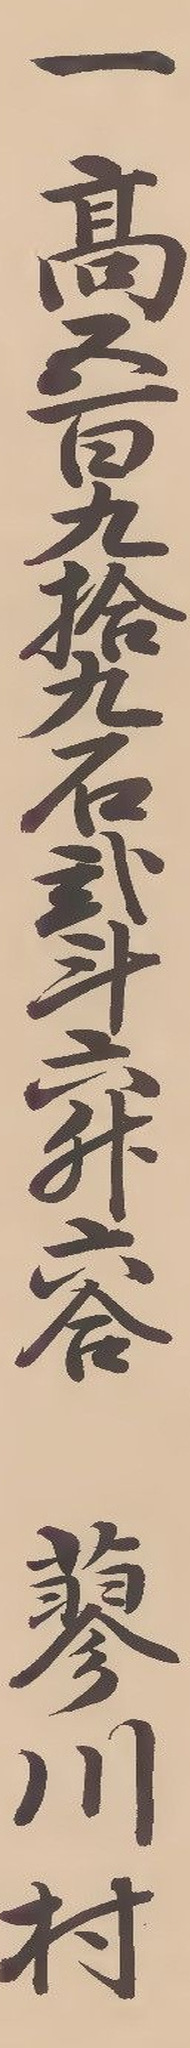一高五百九拾九石弐斗六升六合蓼川村
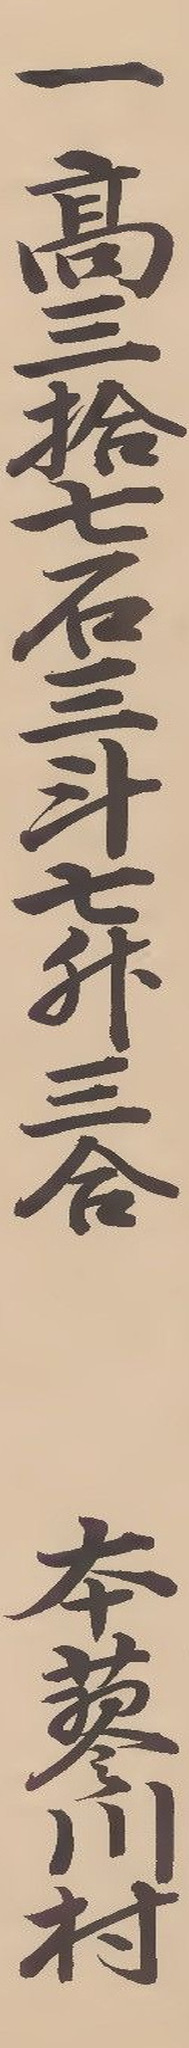一高三拾七石三斗七升三合本蓼川村
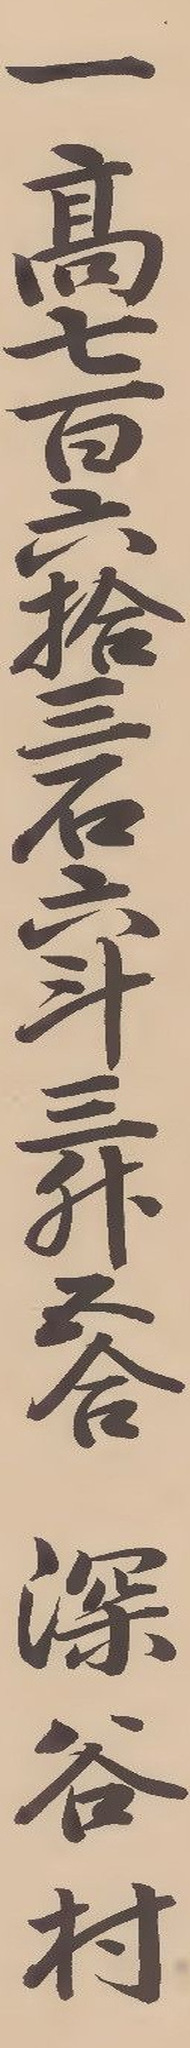一高七百六拾三石六斗三升五合深谷村
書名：相模国郷帳
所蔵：国立公文書館 National Archives of Japan
